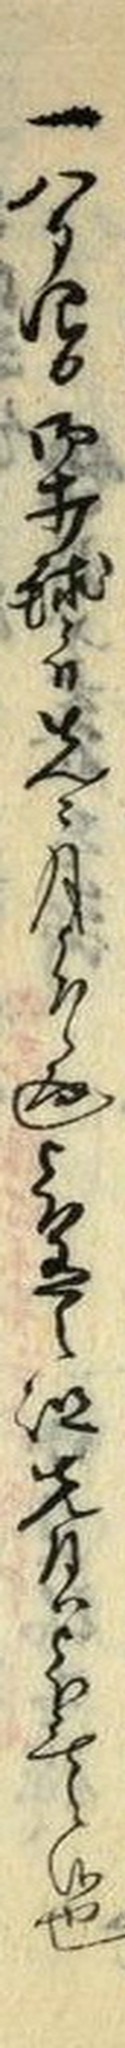一八月四日御打毬ニ付先々月之通被下有之但先月ハ被下無之候也
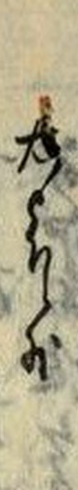右被下之外
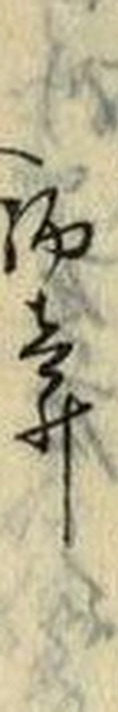酒壱升
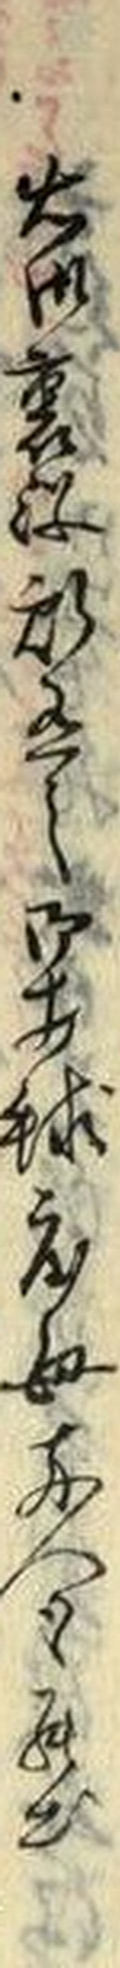右御裏役願有之御打毬度毎両人ツヽ罷出
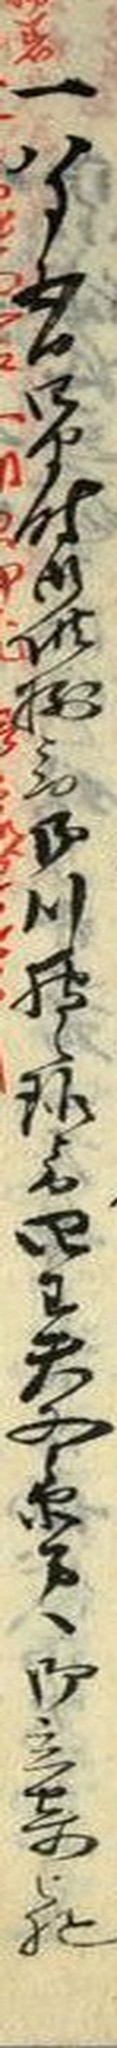一八月五日四半時御供揃ニ而御川狩之趣ニ而四王天又兵衛方へ御立寄被遊
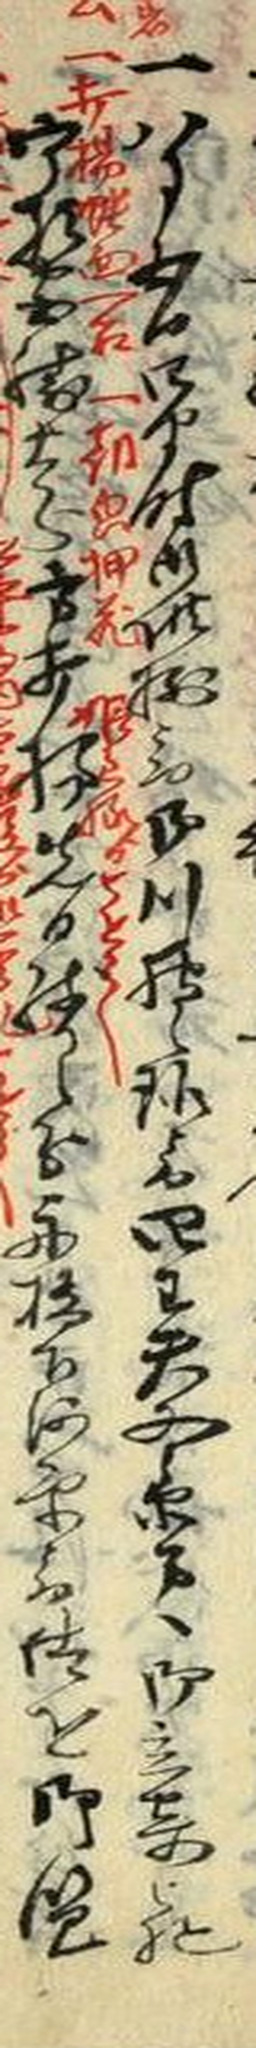宇都宮勝太郎方打揚先日残り之分船橋下河原ニ而仕候を御覧
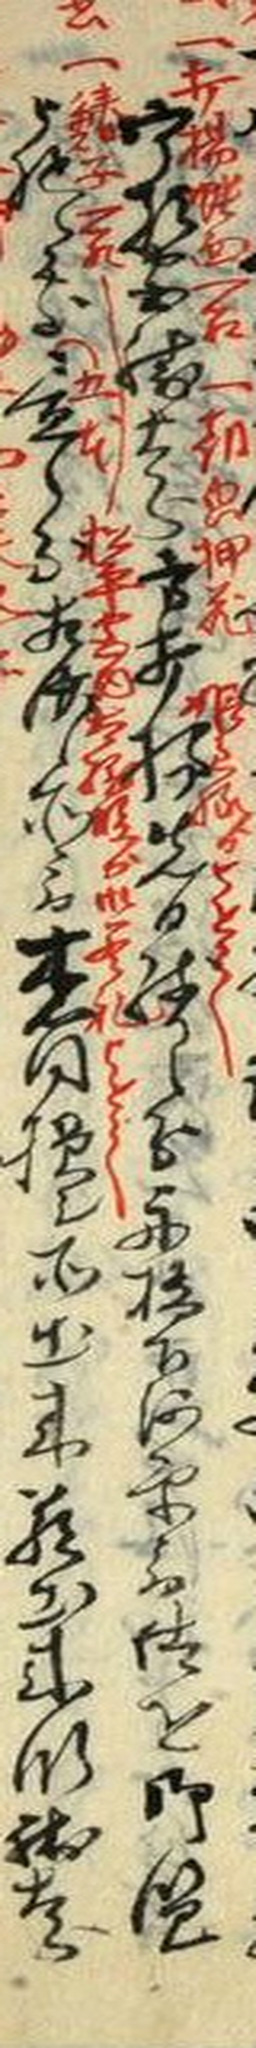被遊候処昼之分相済候所ニ而木筒損シ所出来難出来段勝太郎
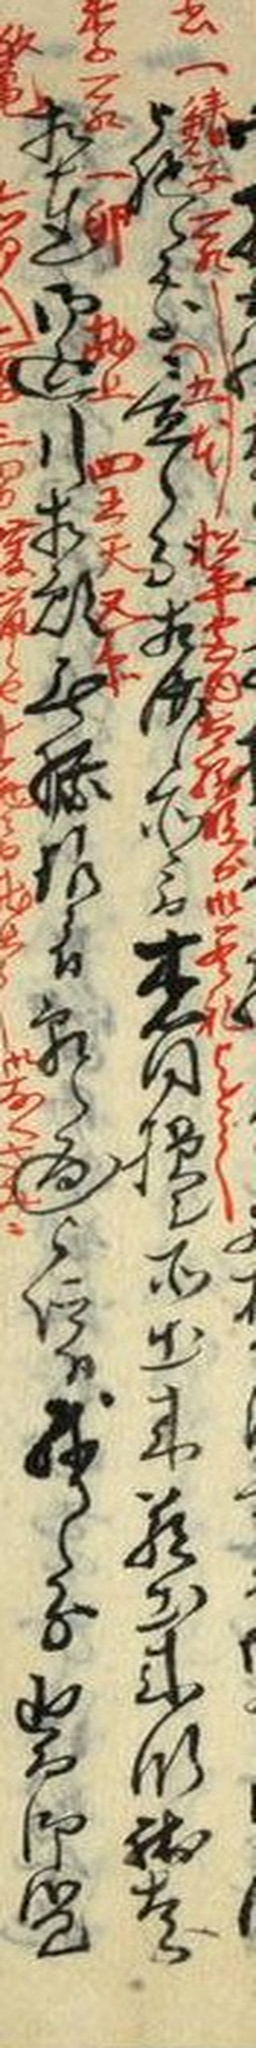相達御延引相願無拠趣ニ付願之通被仰付残り之分追而御覧

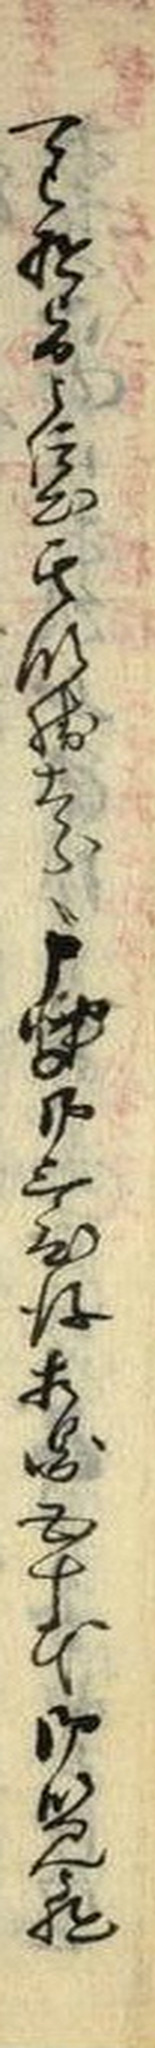可被遊旨被仰出其段勝太郎へ申聞御三度後相図五十本御覧被遊
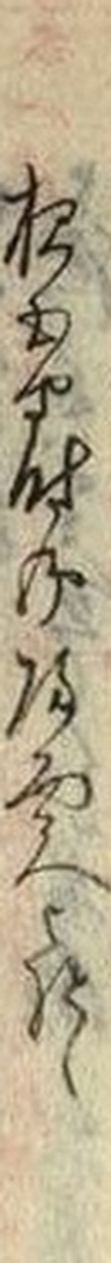夜五半時御帰殿被遊候
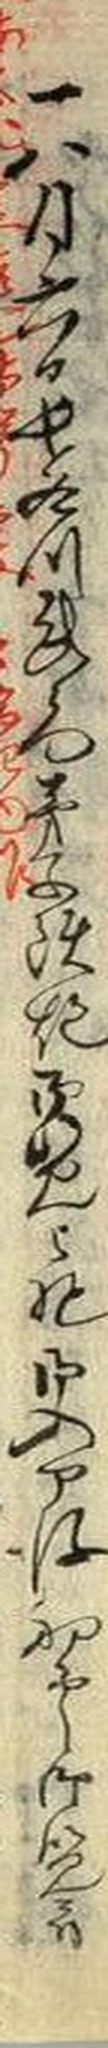一八月六日長谷川武右衛門弟子鉄炮御覧被遊御入部後初而之御覧ニ付
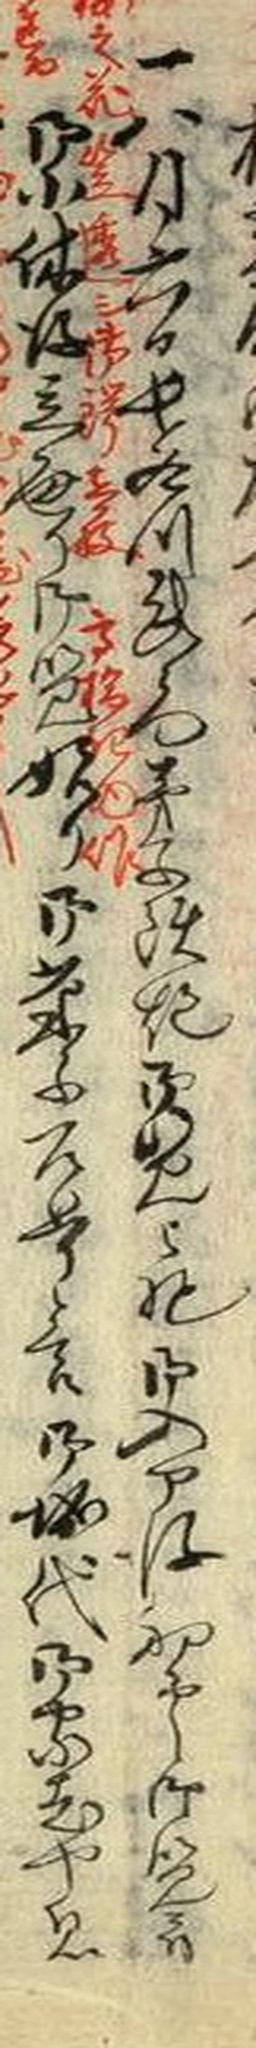御小休後立通り御覧始り御菓子召上り候節御城代御家老中息
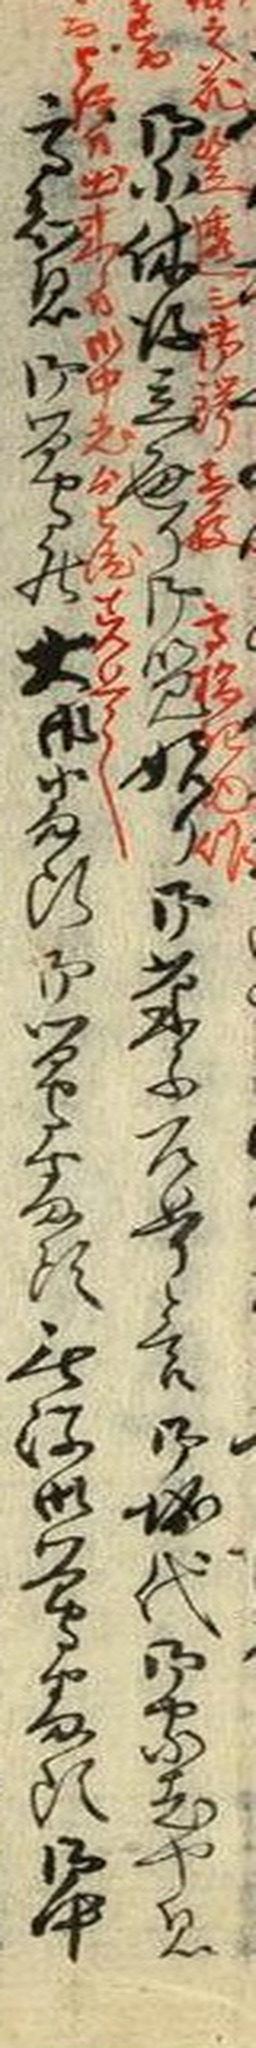高知息御留守居大御番頭御留守番頭無役御留守番頭御中
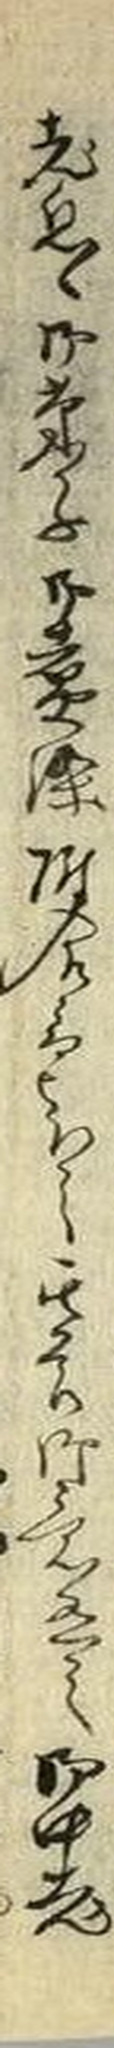老息へ御菓子御煮染附合ニ而被下之其節御意有之御中老
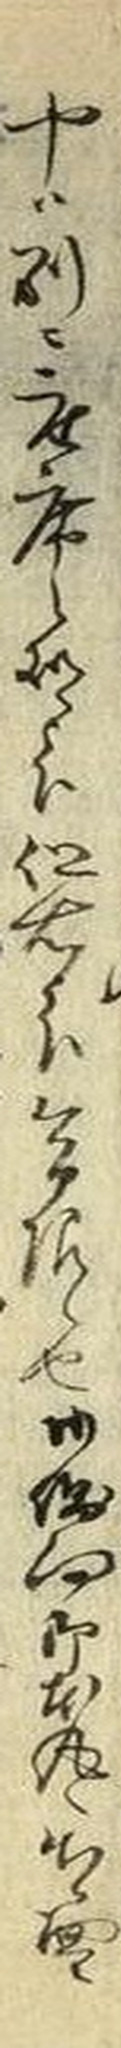中ハ別ニ座席之処へ被下但右被下今日限候由御側向御本丸へ出候面々
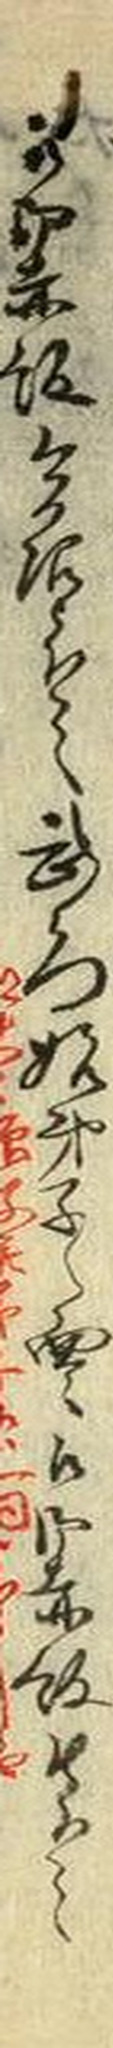江ハ御赤飯今日限被下之武右衛門始弟子之面々江御赤飯被下之
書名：少傅日録抄（斉承付側向頭取日記、在国）
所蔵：福井県文書館 Fukui Prefectural Archives
